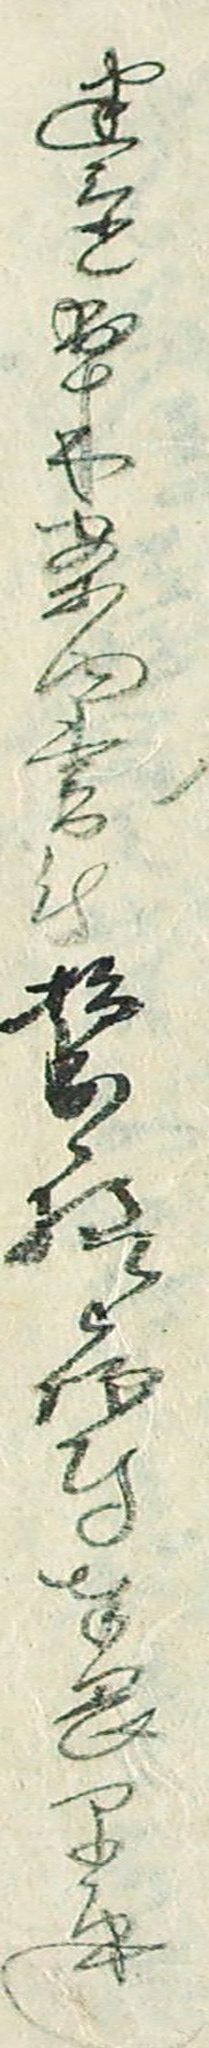建置出来案内書付指出候様被仰付奉畏早速

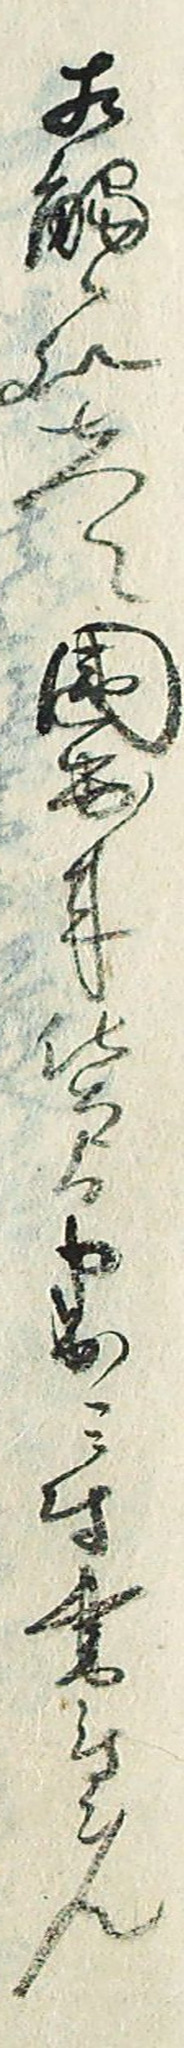相触候処先々囲出来仕候旨申出候に付書付を以
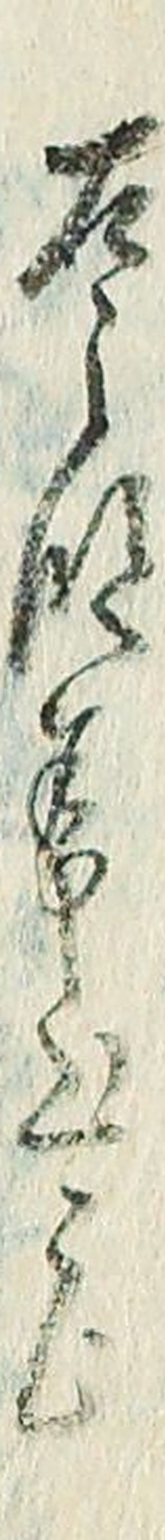右之段奉申上候以上
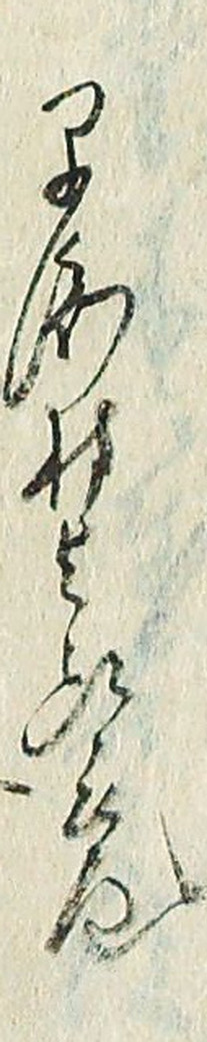早渕村与頭庄屋
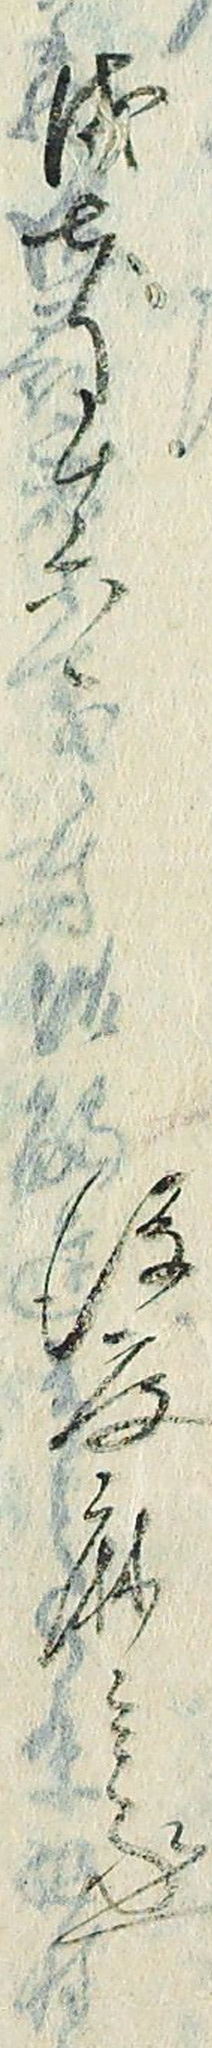戌七月十六日後藤麻之丞
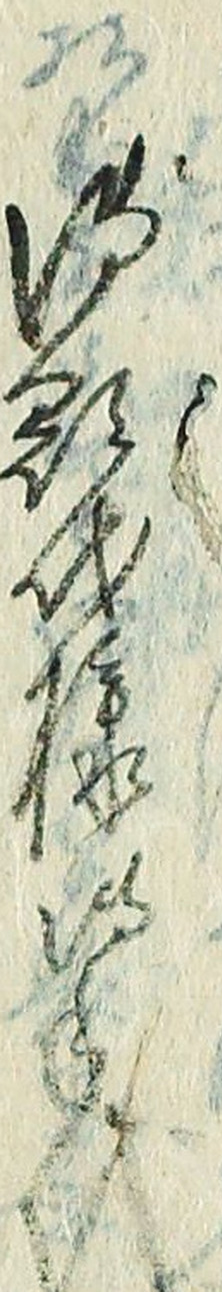御郡代様御手代
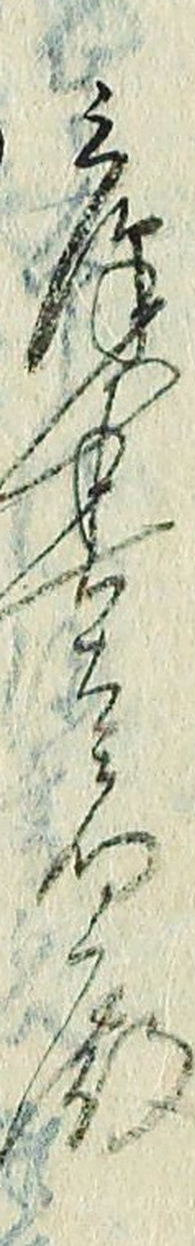三沢春太郎殿
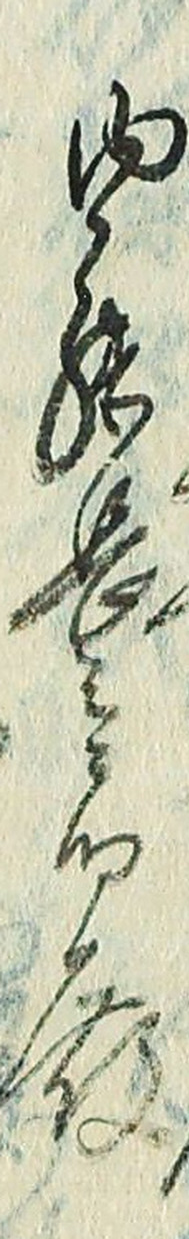内藤長三郎殿
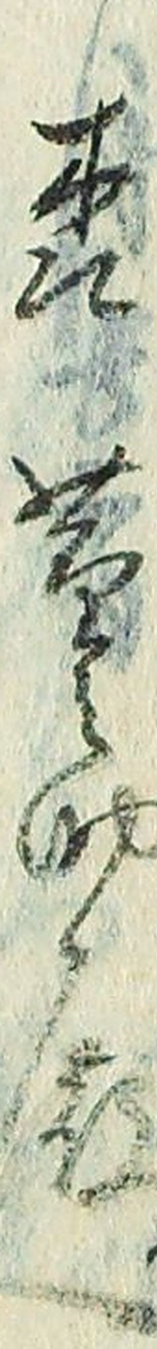森薫之助殿
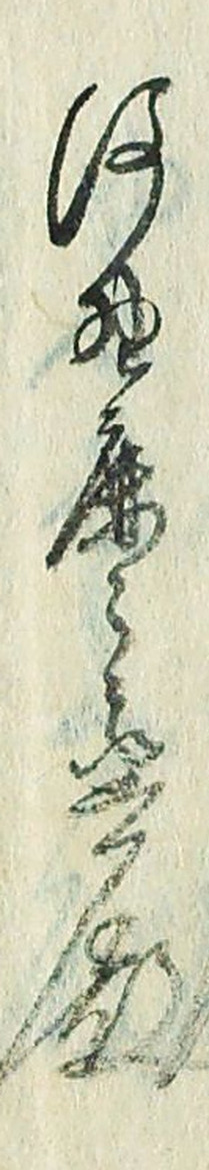河野鹿之丞殿
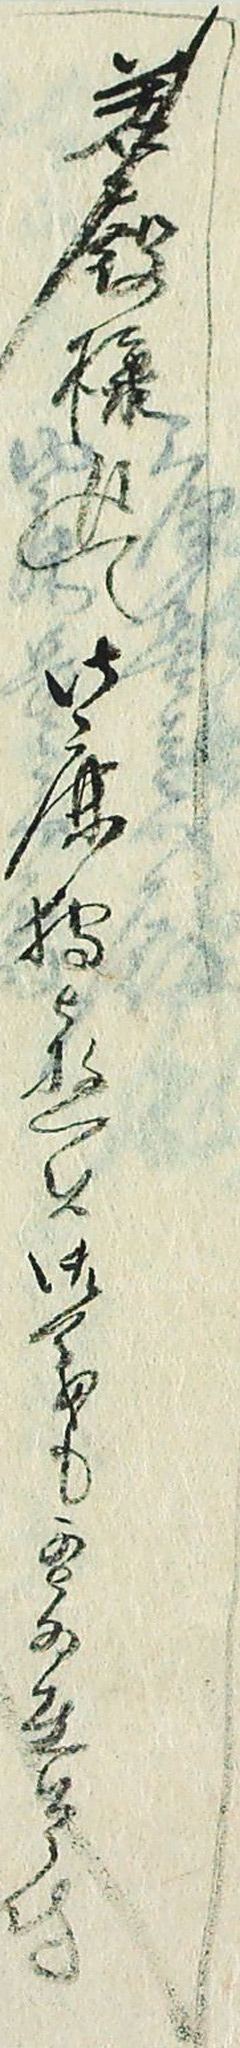若殿様近々御鹿狩被遊候御義も可被為在候に付
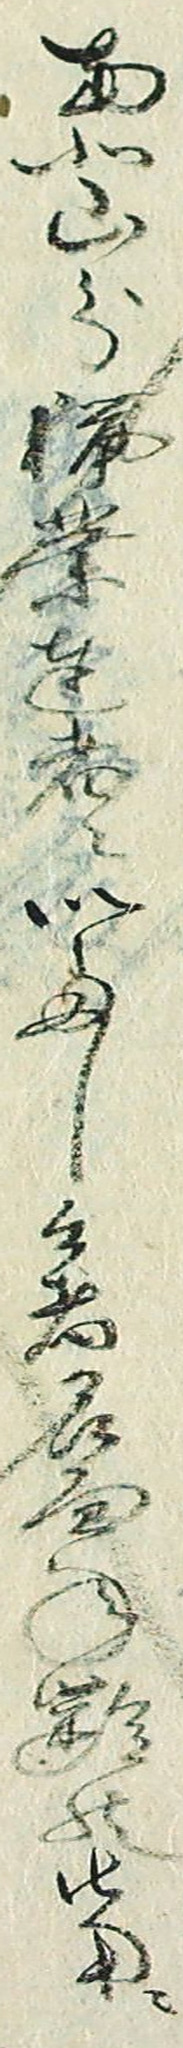南北山分猟業達者にいたし候者名面年齢共御用に
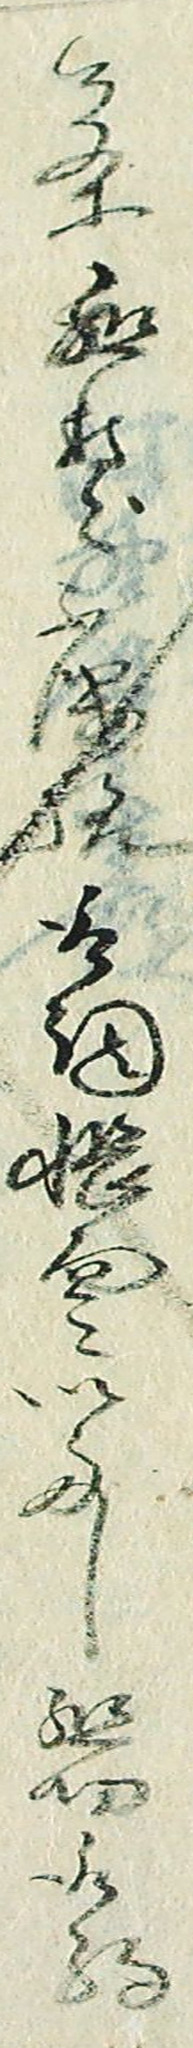候条組村々不洩様取調帳面にいたし組切取都
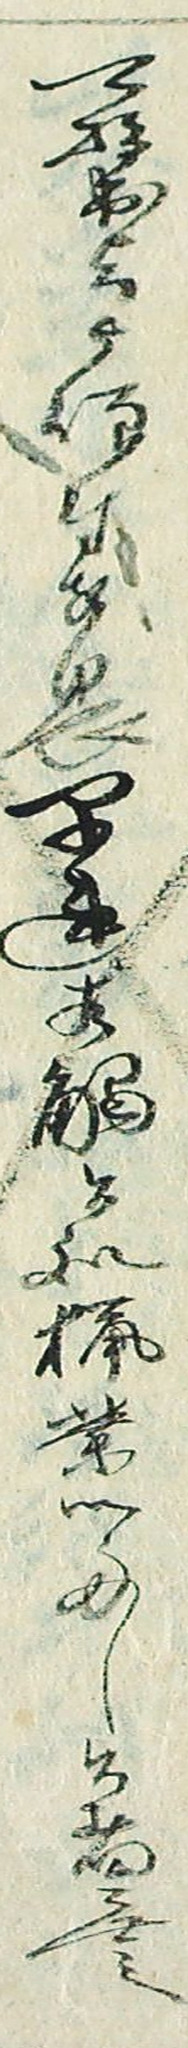可指出旨被仰付奉畏早速相触候処猟業いたし候者無之
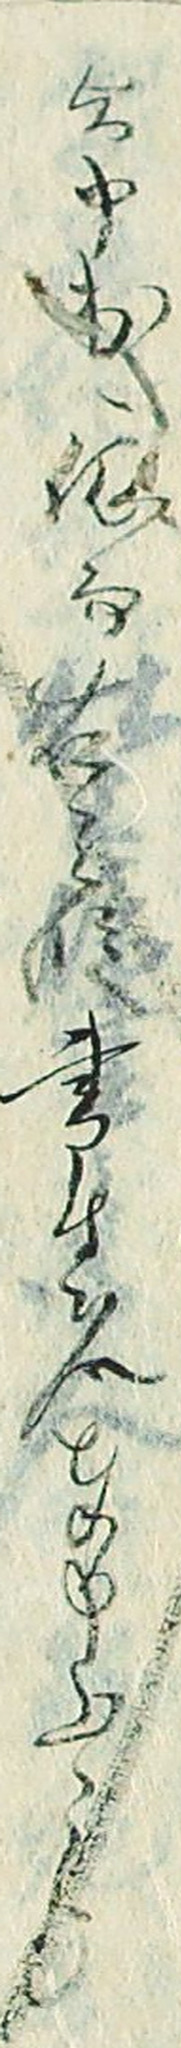旨申出候依而右之段書付を以奉申上候以上

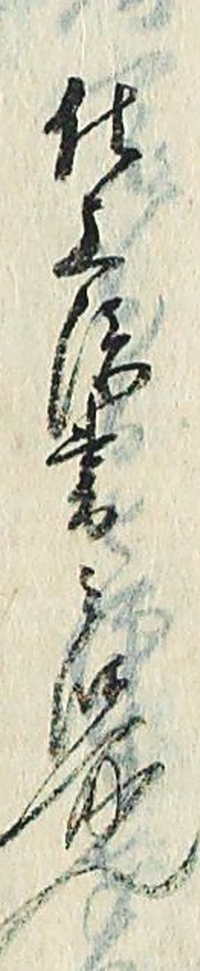仕上添書之覚
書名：諸御用御□受書控
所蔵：鳴門教育大学 Naruto University of Education
